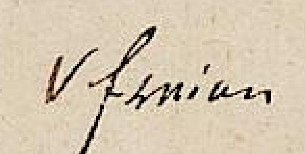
V freien
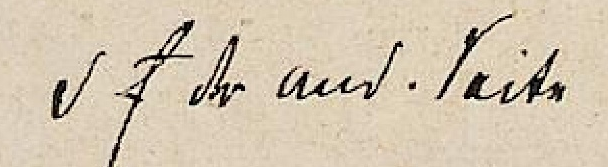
V f dr and. Seite
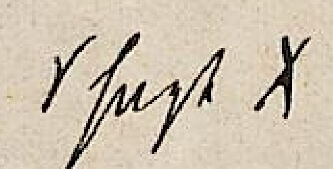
V sagt Χ
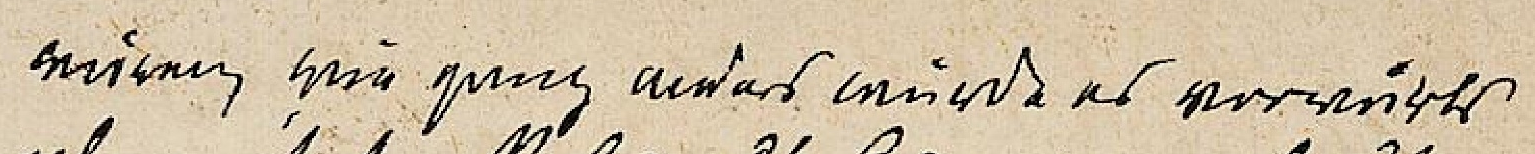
wären, wie ganz anders würde es vorwärts
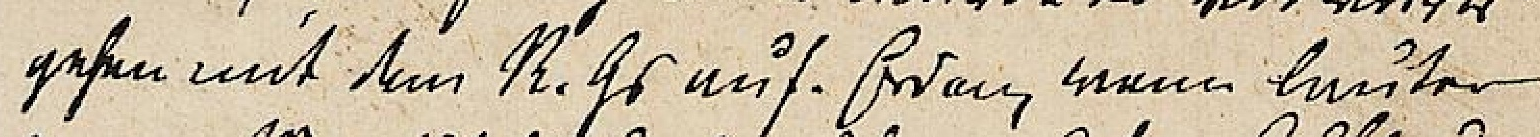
gehen mit dem R. Gs. uns. Erden, wenn lauter
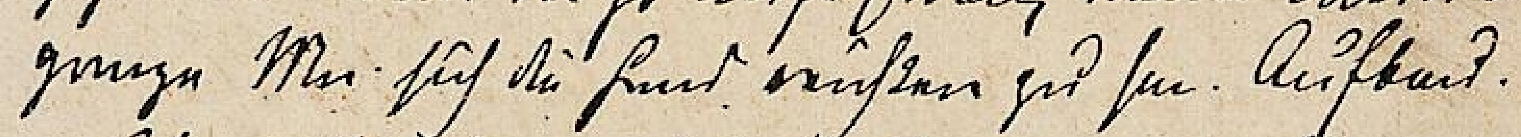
ganze Mn. sich die Hand reichten zu sm. Aufbau.
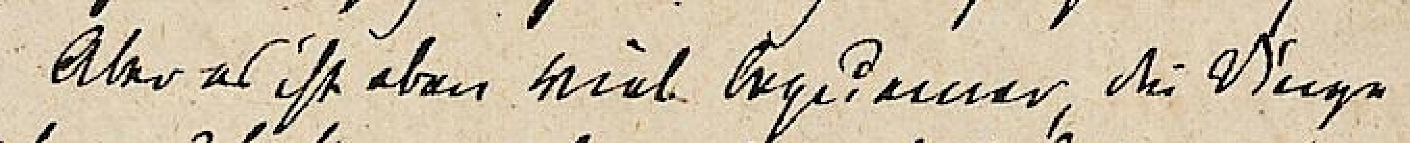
Aber es ist eben viel bequemer, die Dinge
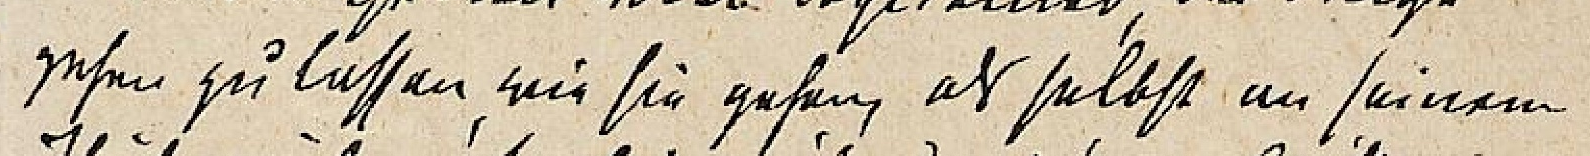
gehen zu lassen wie sie gehen, als selbst an seinem
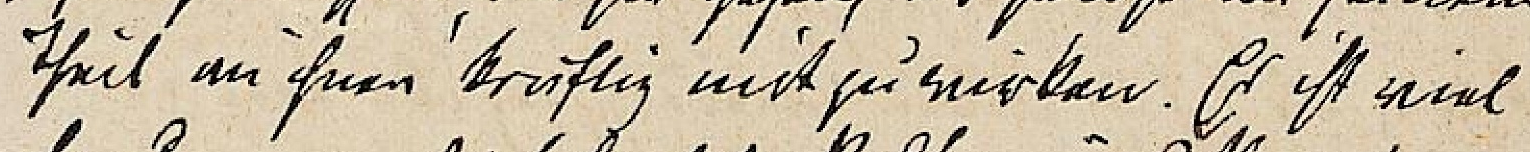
Theil an ihne kräftig mitzuwirken. Es ist viel
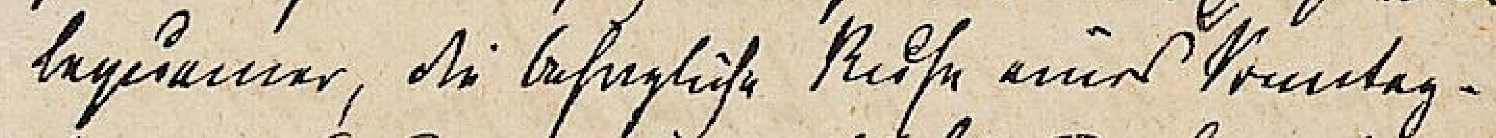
bequemer, die behagliche Ruhe eines Sonntag¬
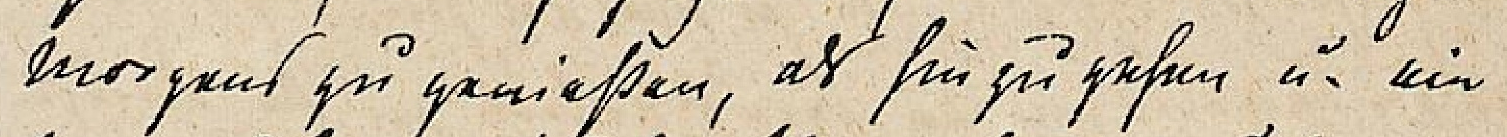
morgens zu genießen, als hinzugehen u. ein
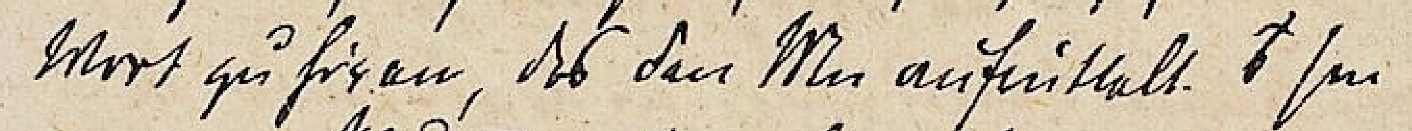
Wort zu hören, das den Mn. aufrüttelt s sm
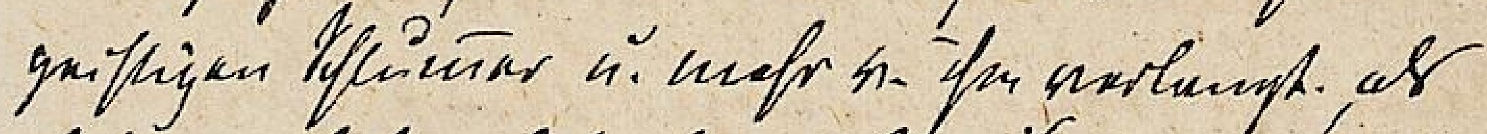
geistigen Schlumer u mehr v ihm verlangt, als
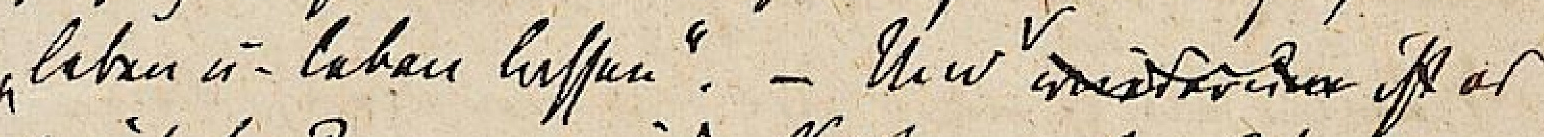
"leben u. leben lassen." _ Und wiederum ist es
